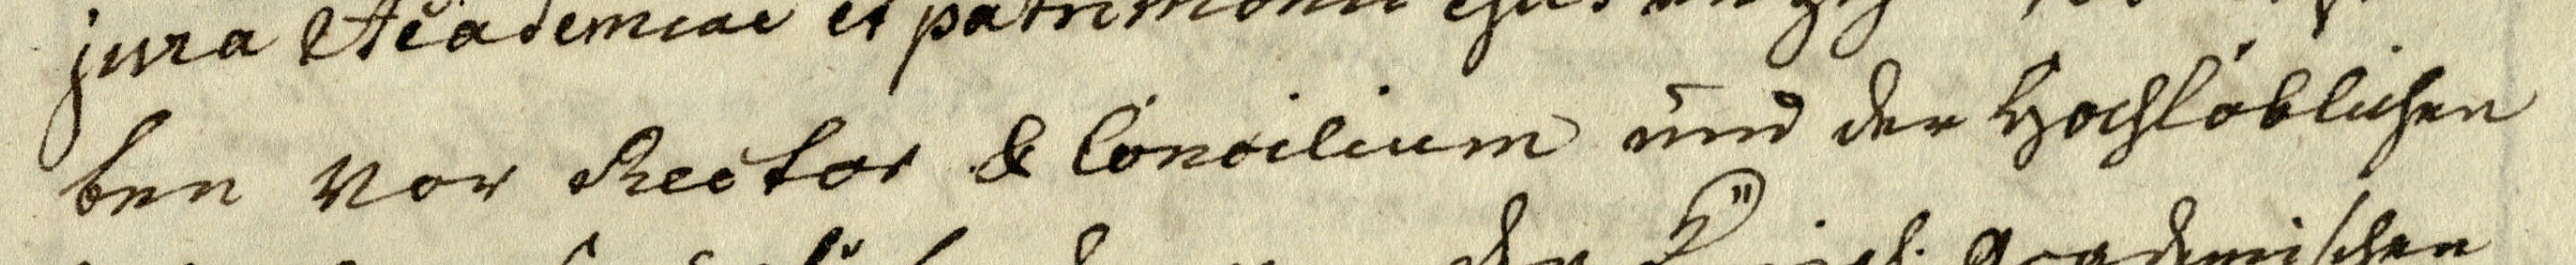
ben vor Rector et Concilium und der Hochlöblichen
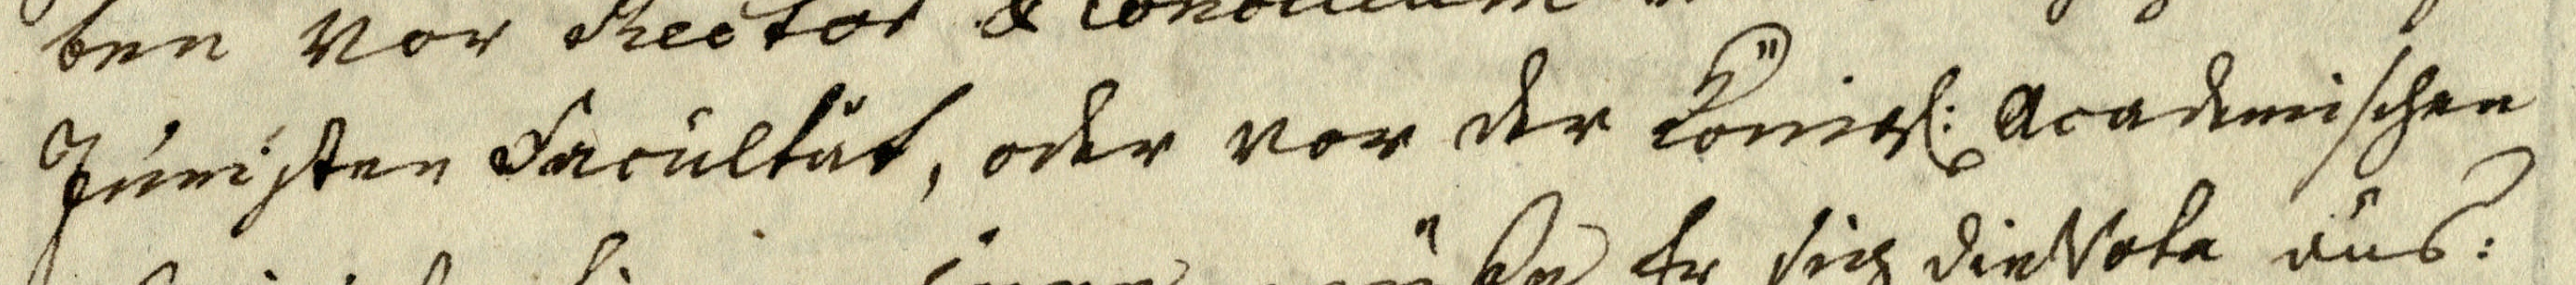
Juristen Facultät, oder von der Königl. Academischen
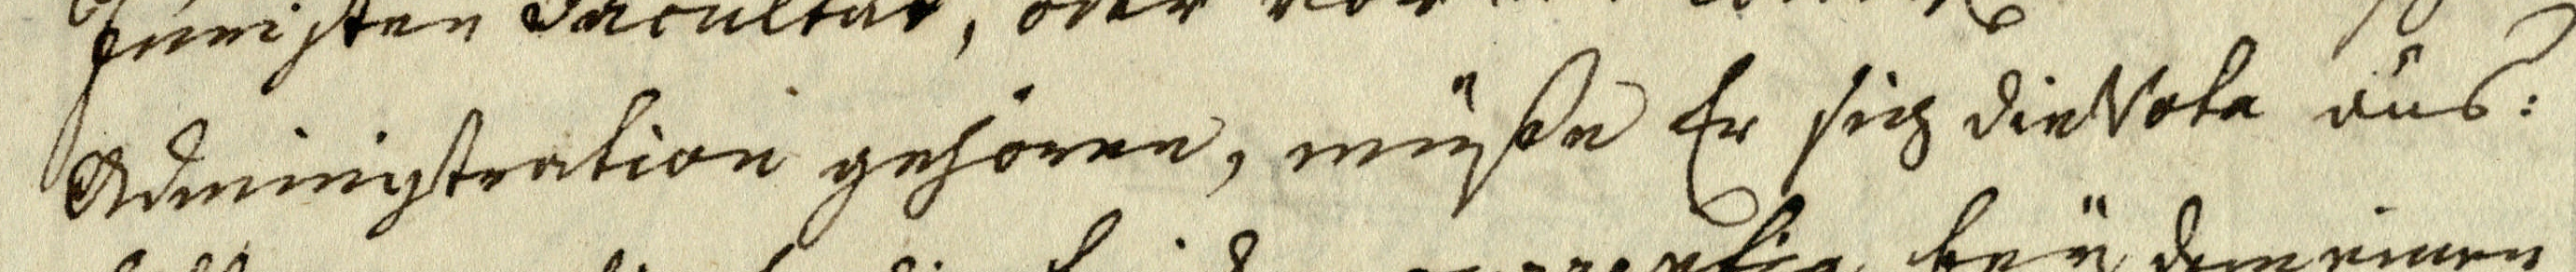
Administration gehören, müßte Er sich die Vota aus¬
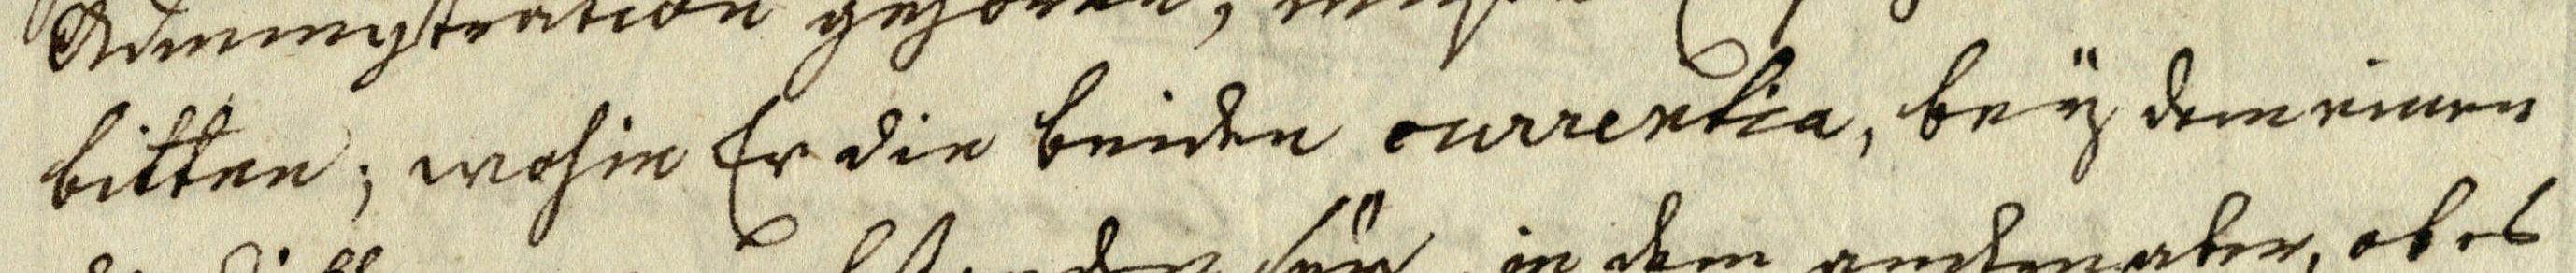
bitten; wohin Er die beiden currentia, beÿ dem einem
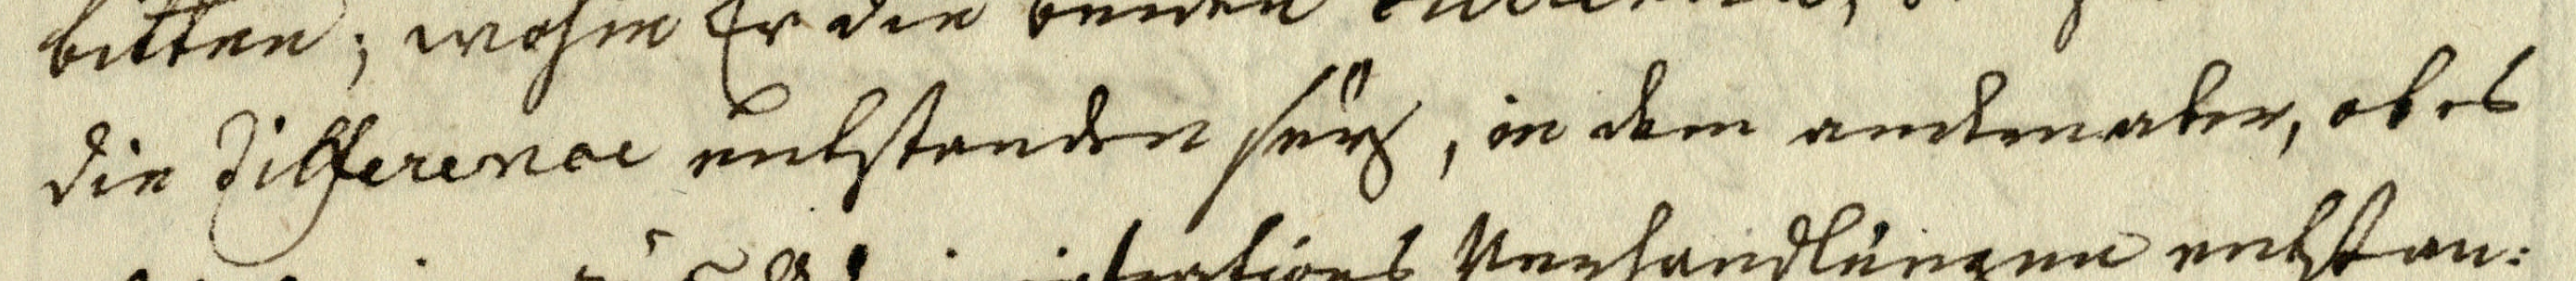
die difference entstanden seÿ, in dem andern aber, ob es
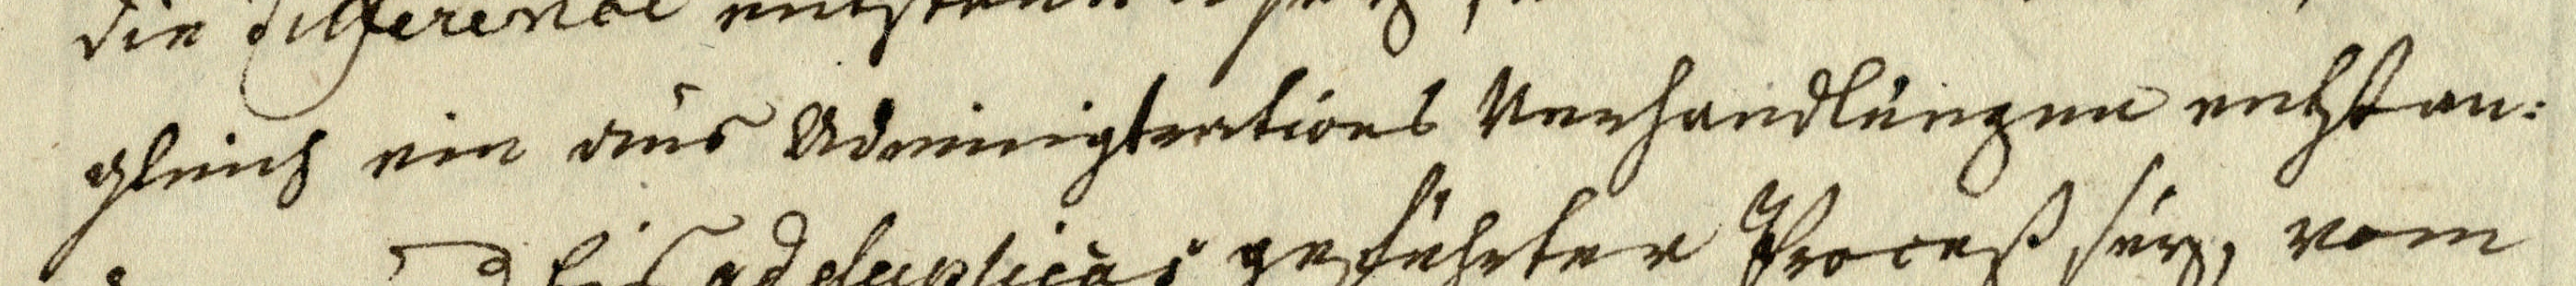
gleich ein aus Administrations Verhandlengun entstan¬
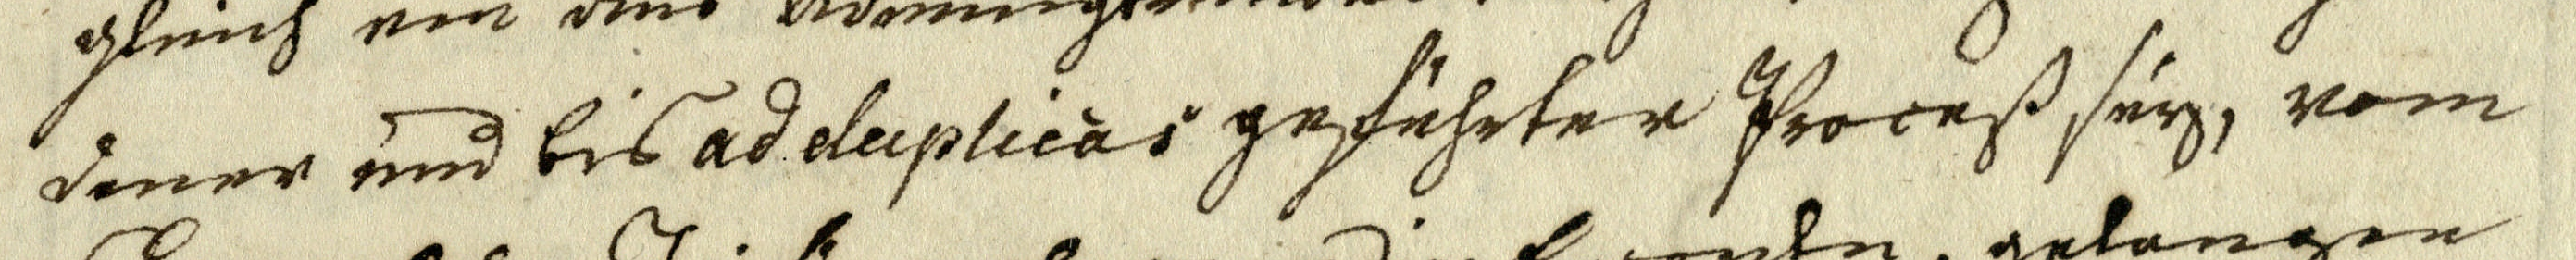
dener und bis ad duplicas geführter Proceß seÿ, vom
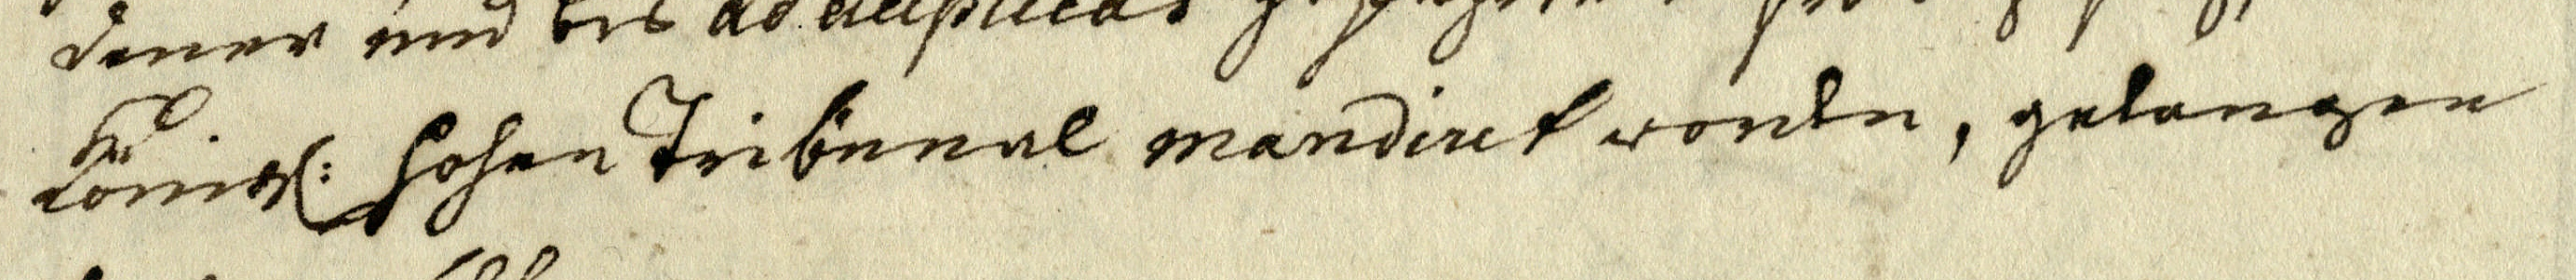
Königl. hohen Tribunal mandiret worden, gelangen
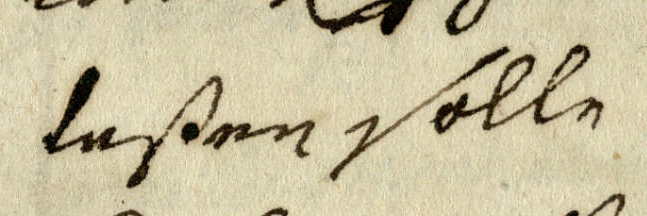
lassen solle
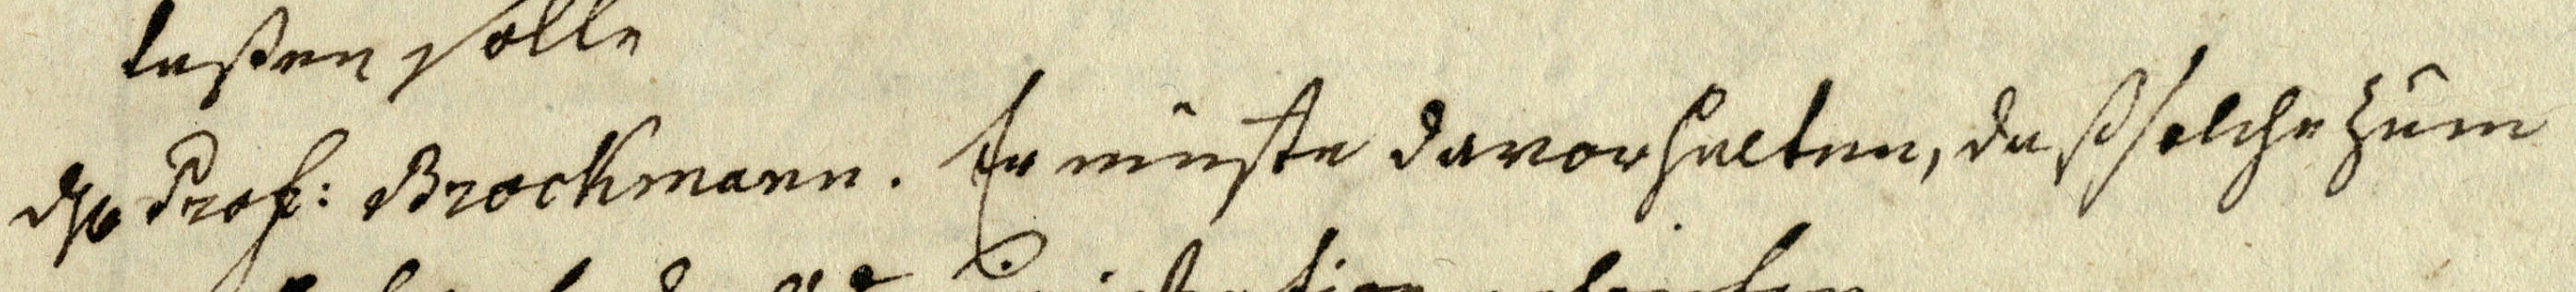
dh Prof: Brockmann. Er müßte davor halten, daß solche zum
